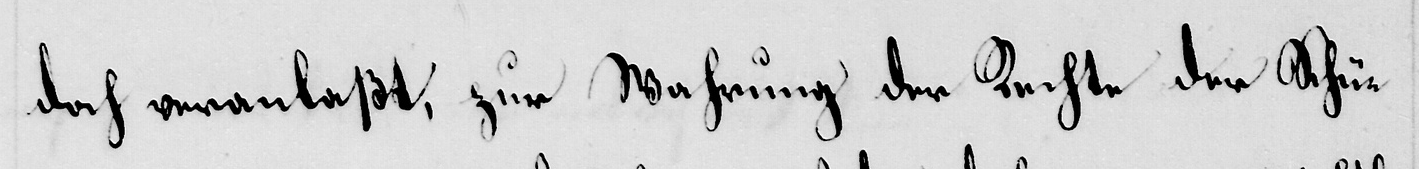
doch veranlaßt, zur Wahrung der Rechte der Schü¬
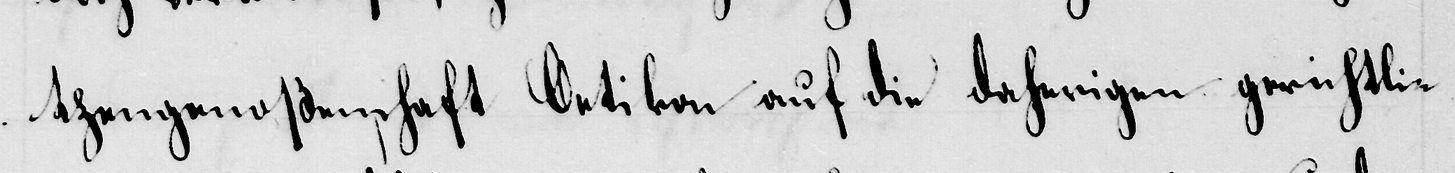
tzengenoßenschaft Oetikon auf die daherigen gerichtli¬
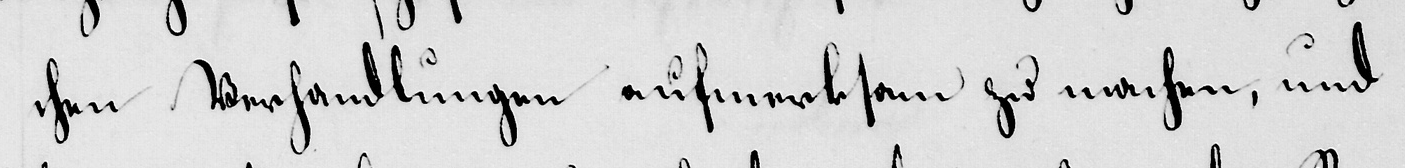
chen Verhandlungen aufmerksam zu machen, und
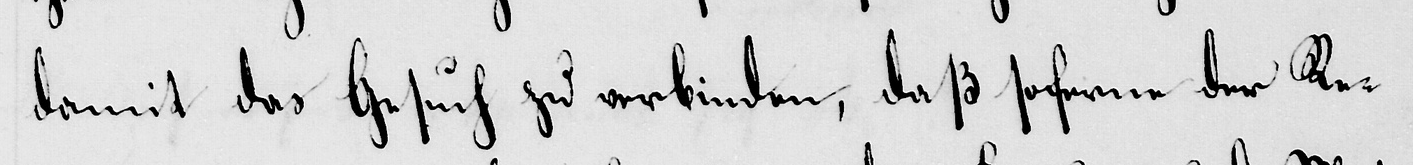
damit das Gesuch zu verbinden, daß soferne der Re¬
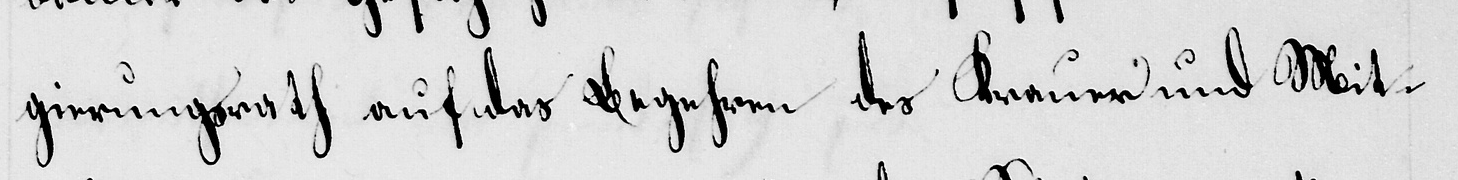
gierungsrath auf das Begehren des Krauer und Mit¬
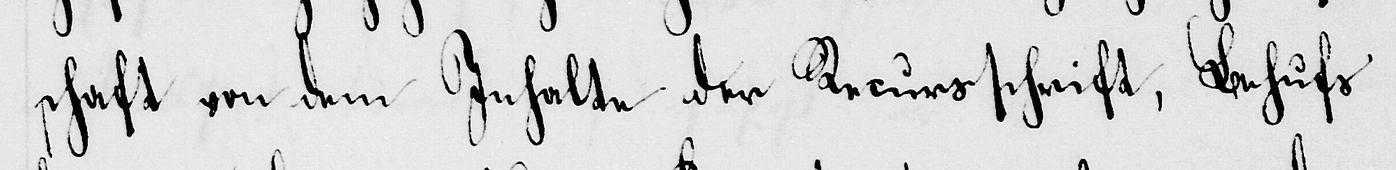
schaft von dem Inhalte der Recursschrift, Behufs
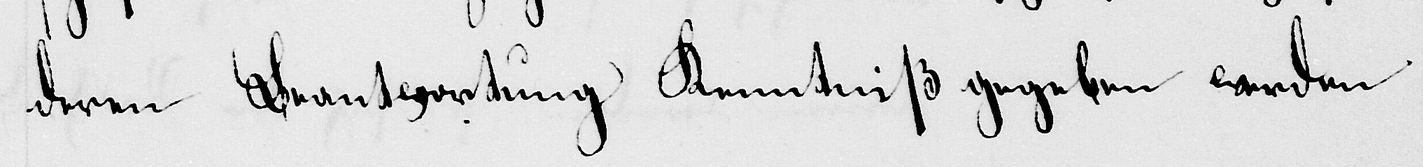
deren Beantwortung Kenntniß gegeben werden
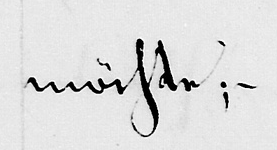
möchte; –
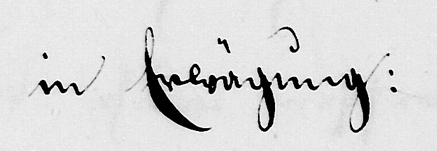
in Erwägung:
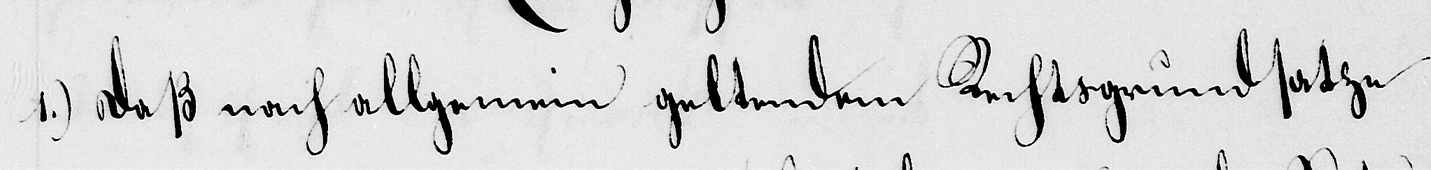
1.) Daß nach allgemein geltendem Rechtsgrundsatze
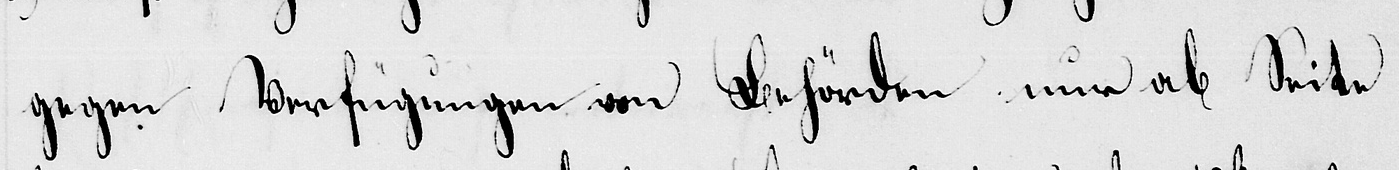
gegen Verfügungen von Behörden nur ab Seite
